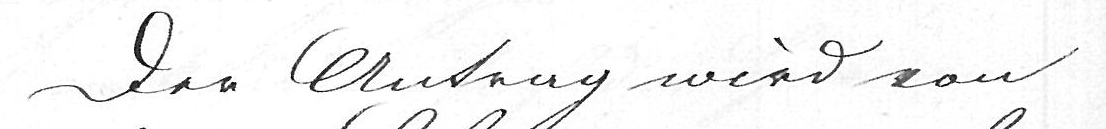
Der Antrag wird von
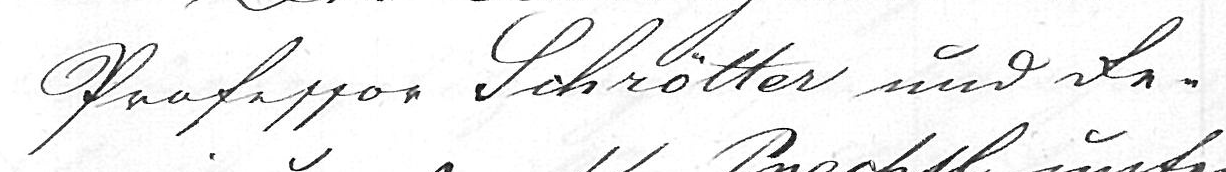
Professor Schrötter und Re-
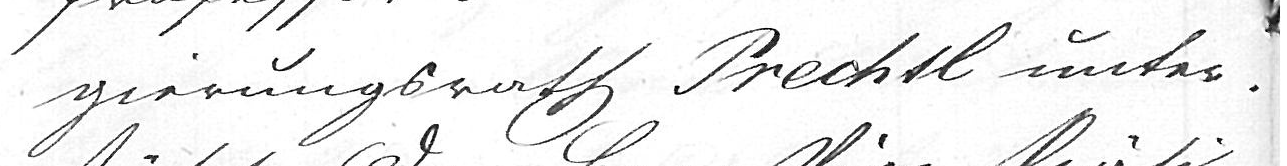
gierungsrath Prechtl unter-
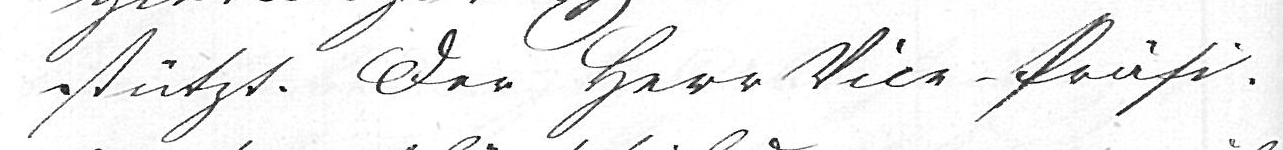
stützt. Der Herr Vice-Präsi-
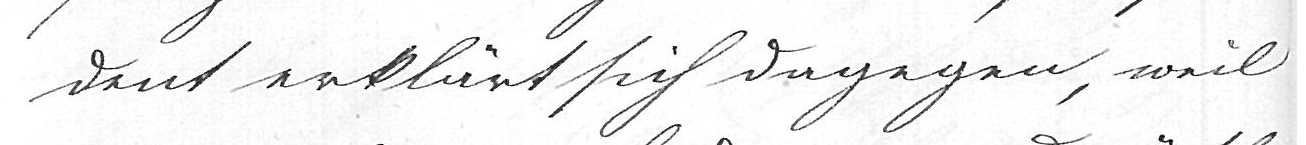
dent erklärt sich dagegen, weil
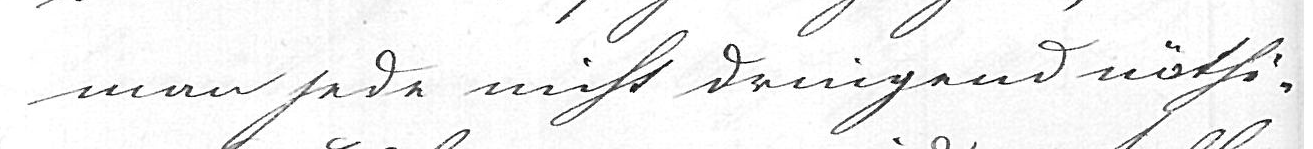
man jede nicht dringend nöthi-
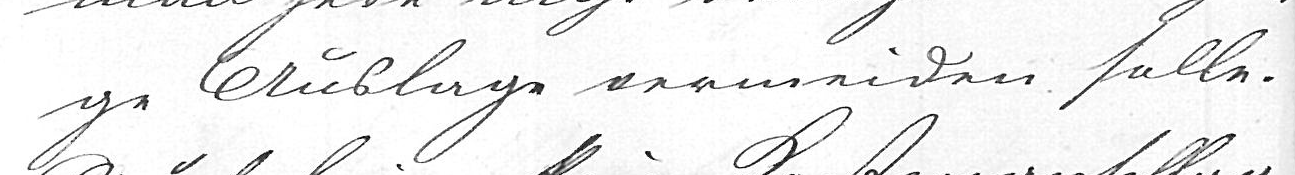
ge Auslage vermeiden solle.
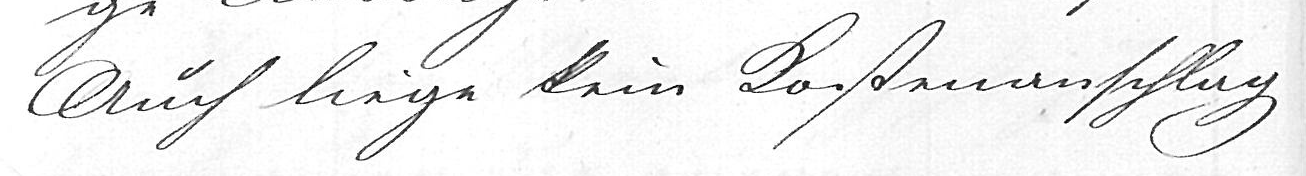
Auch liege kein Kostenanschlag
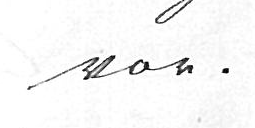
vor.
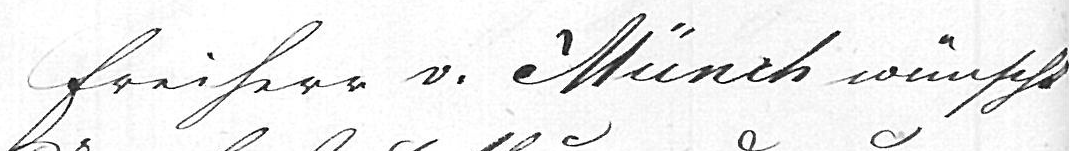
Freiherr v. Münch wünscht
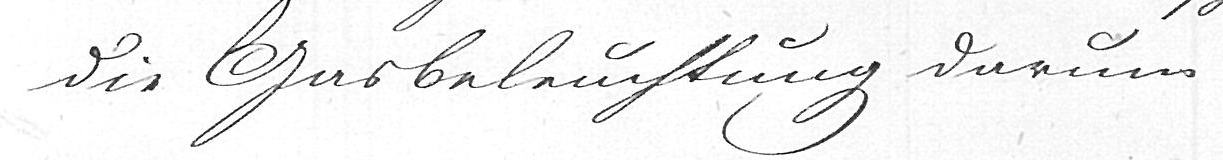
die Gasbeleuchtung darum
